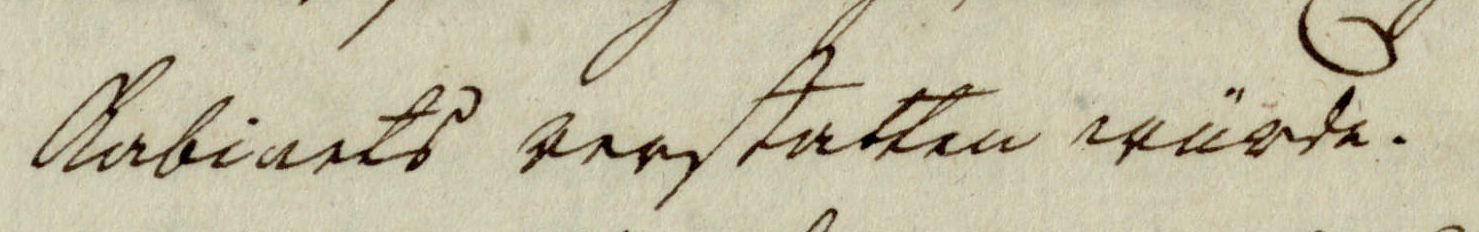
Kabinets verstatten würde.
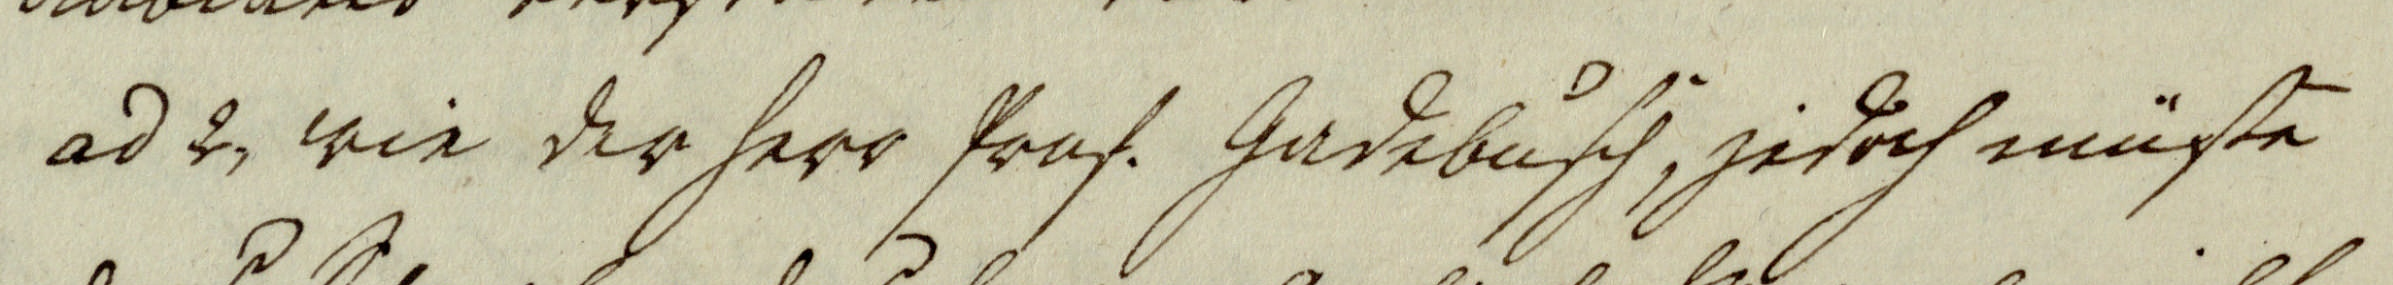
ad 2., wie der Herr Prof. Gadebusch, jedoch müßte
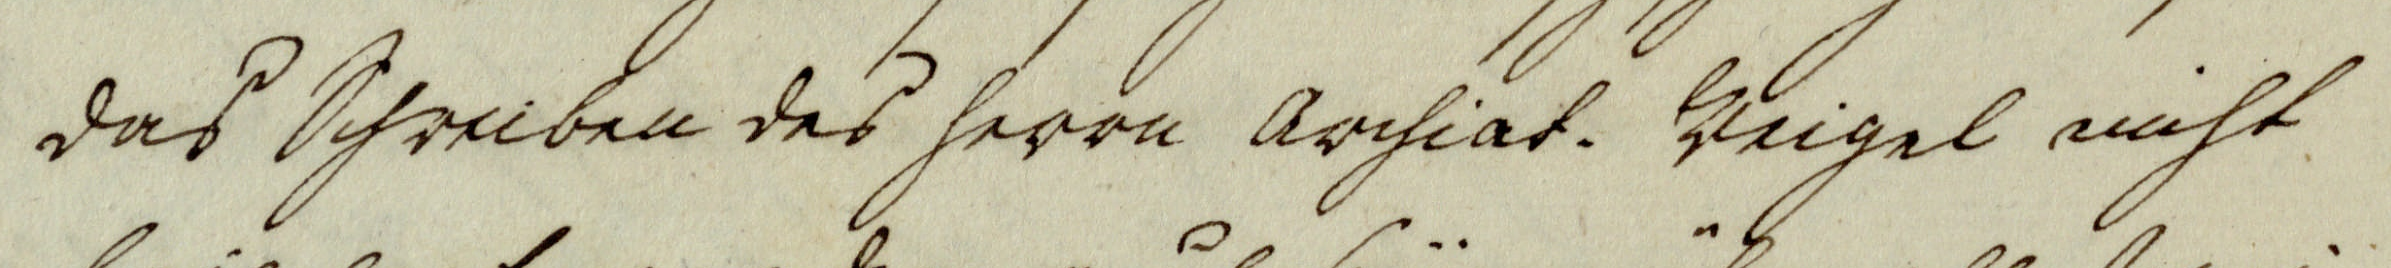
das Schreiben des Herrn Archiat. Weigel nicht
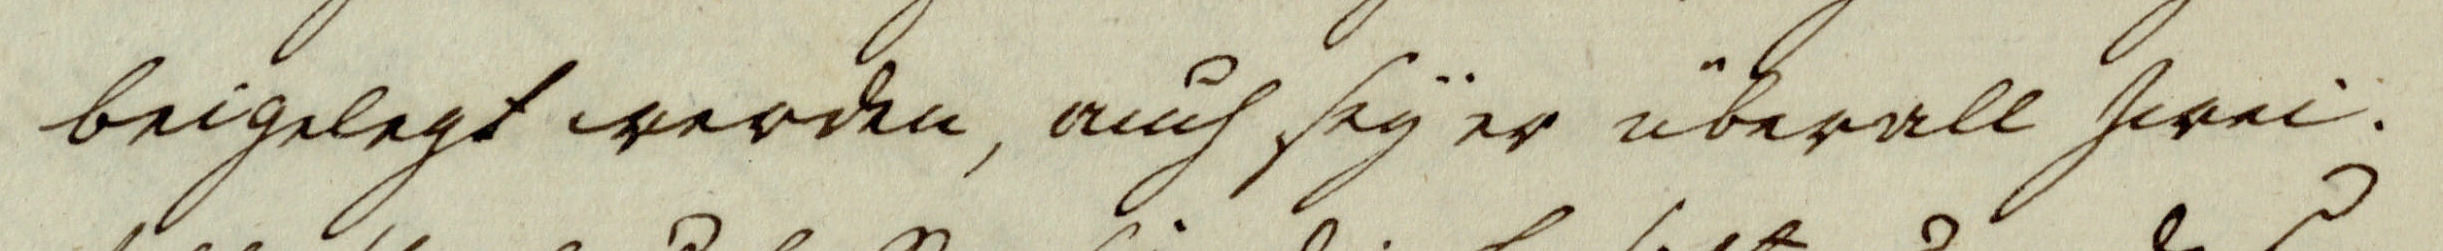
beigelegt werden, auch seÿ er überall zwei¬
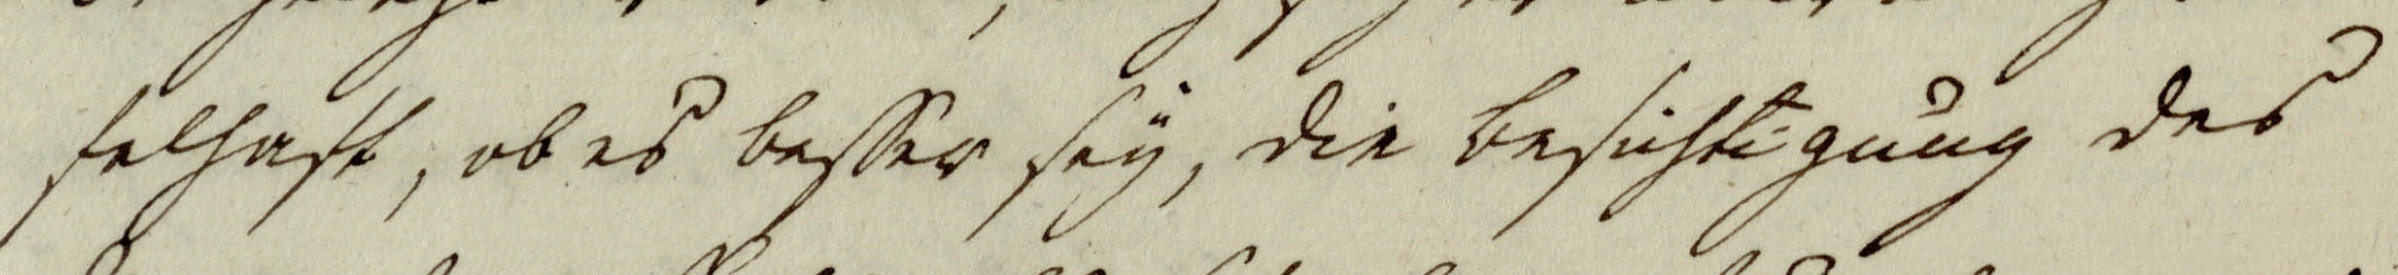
felhaft, ob es besser seÿ, die Besichtigung des
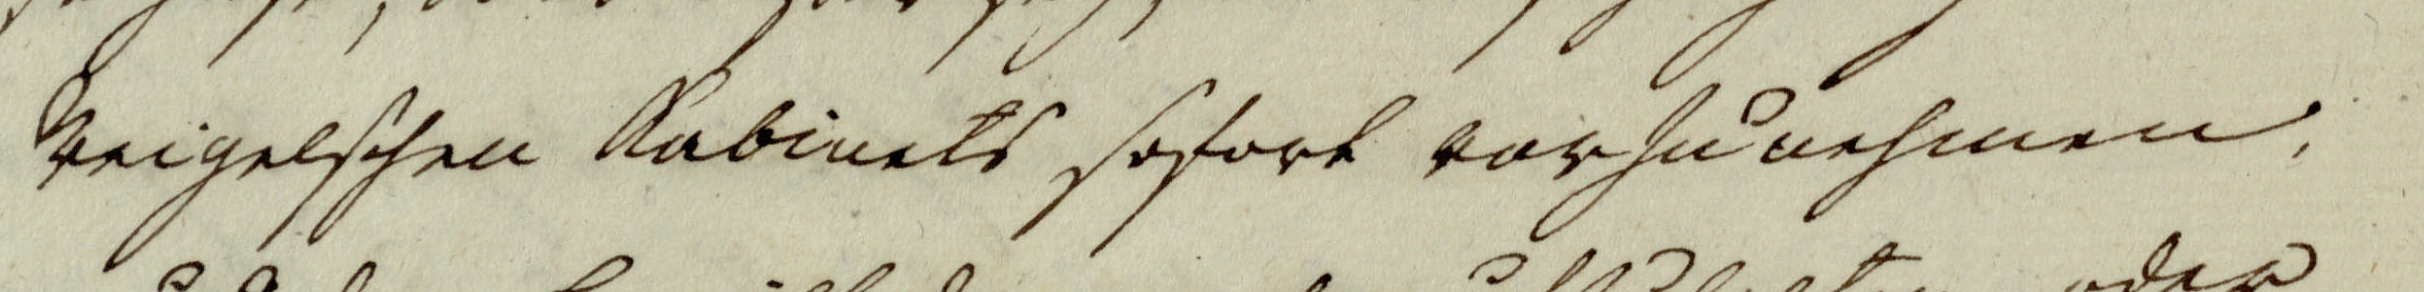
Weigelschen Kabinets sofort vorzunehmen
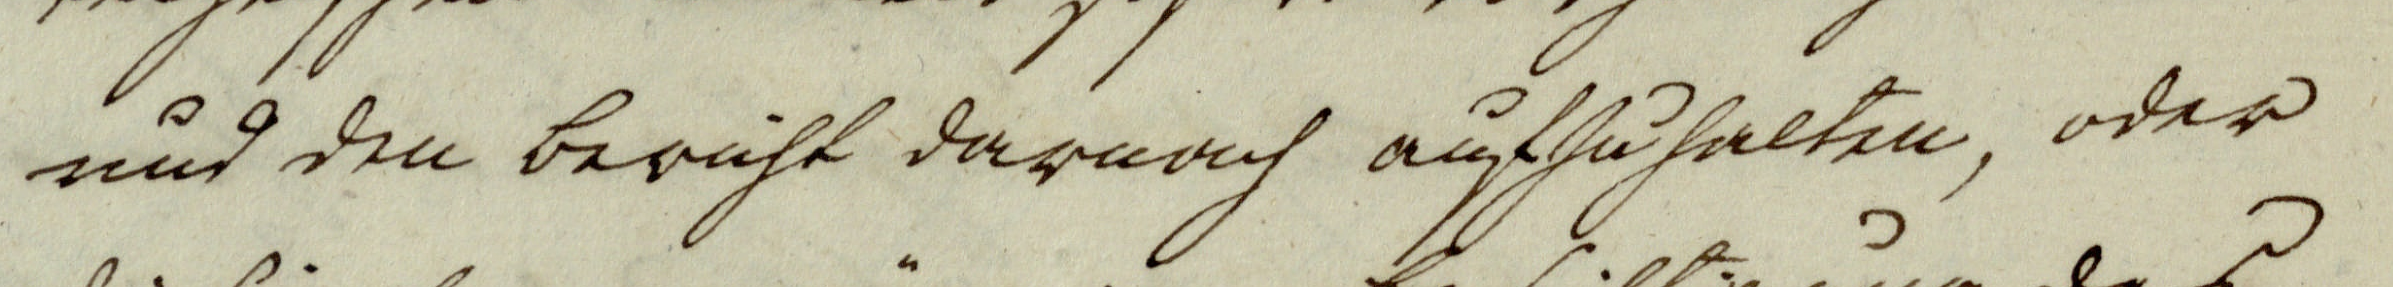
und den Bericht darnach aufzuhalten, oder
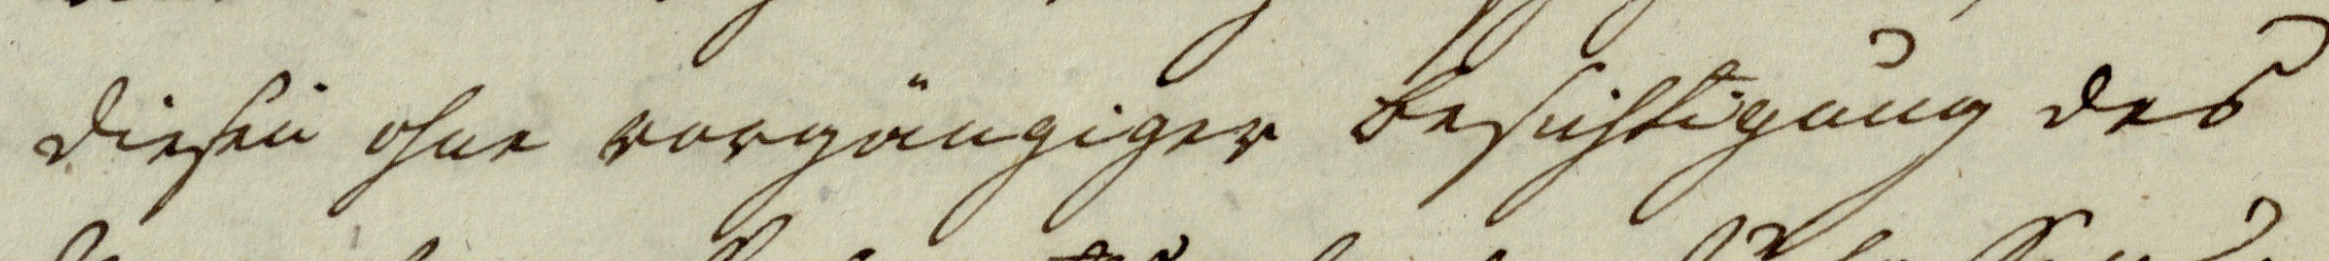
diesen ohne vorgängiger Besichtigung des
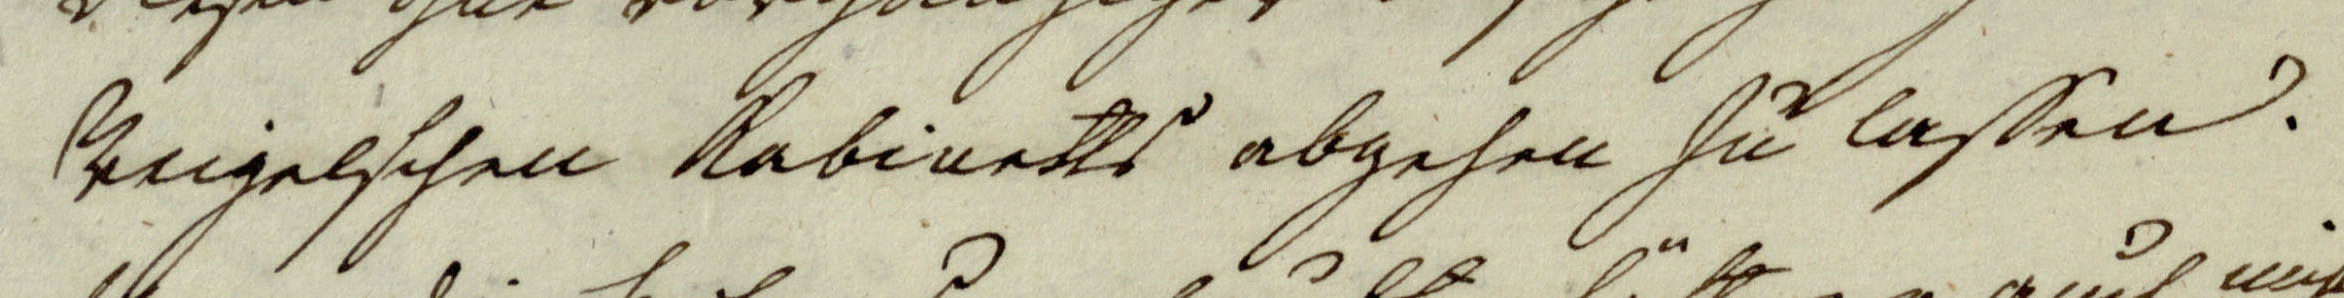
Weigelschen Kabinets abgehen zu lassen.
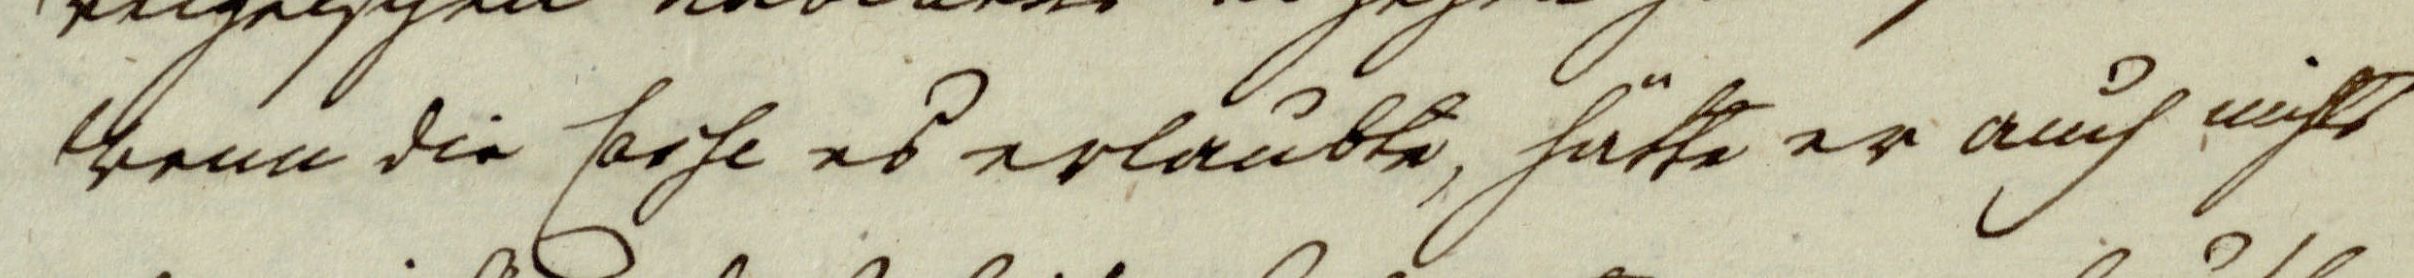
Wenn die Casse es erlaubte, hätte er auch nichts
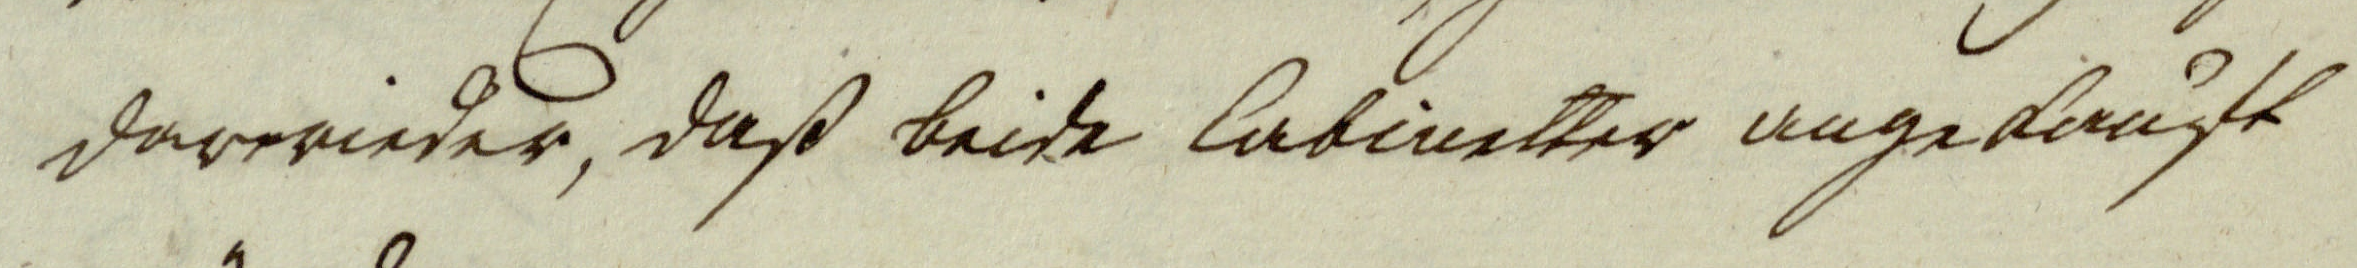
darwieder, daß beide Cabinetter angekauft
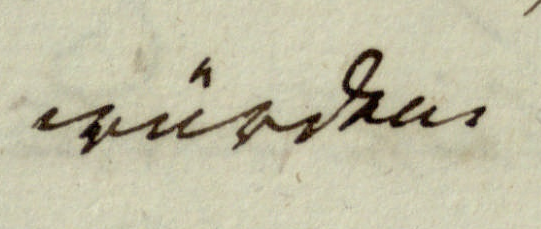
würden.
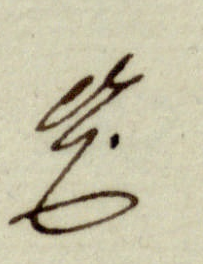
dh.
